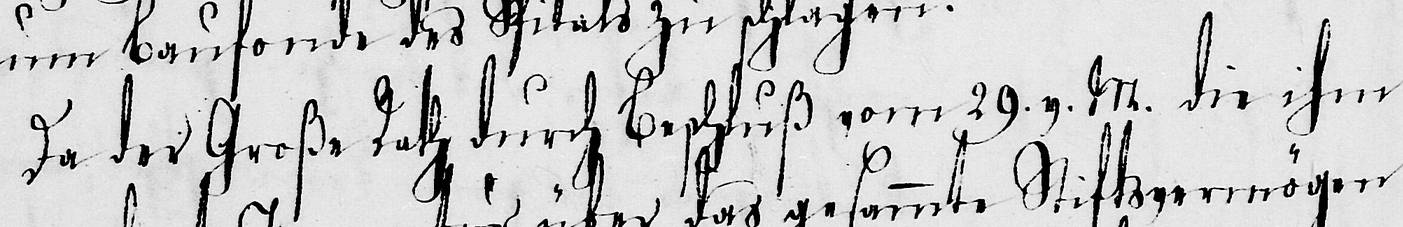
Da der Große Rath durch Beschluß vom 29. v. M. die ihm
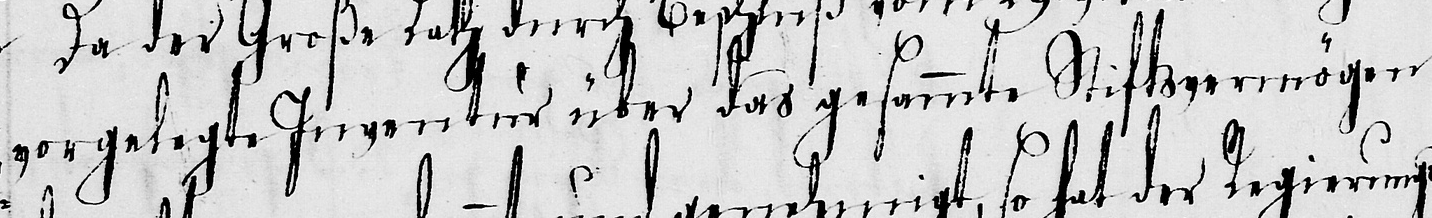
vorgelegte Inventur über das gesammte Stiftsvermögen
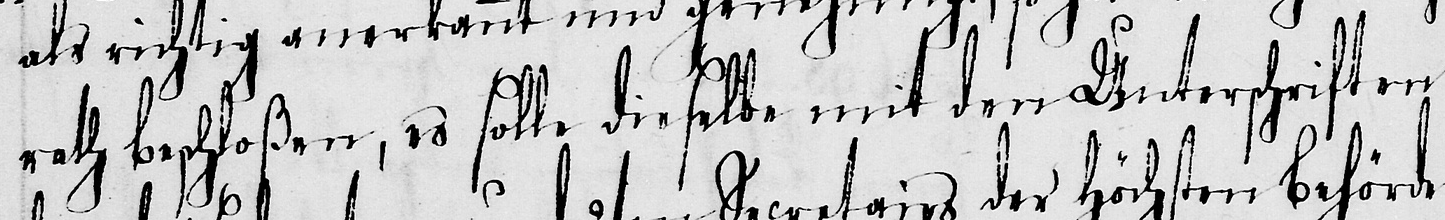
rath beschloßen, es solle dieselbe mit den Unterschriften
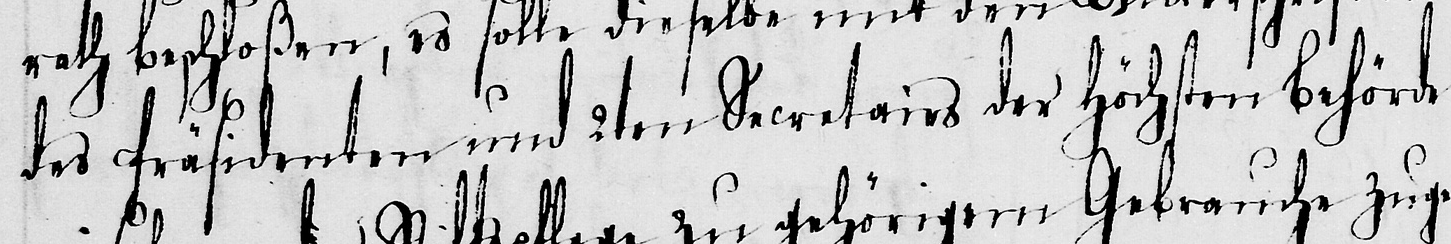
des Präsidenten und 2ten Secretairs der Höchsten Behörde
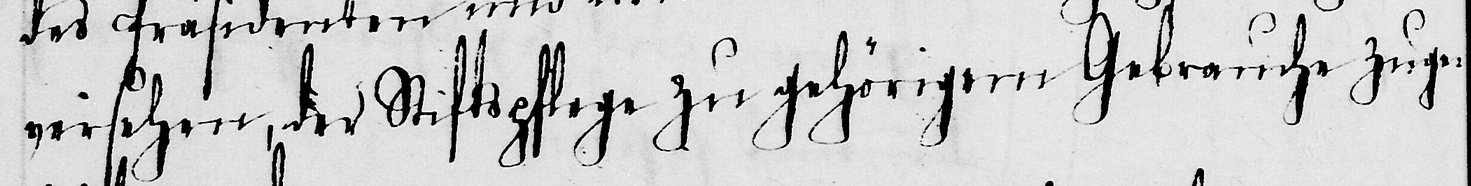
versehen, der Spitalpflege zu gehörigem Gebrauche zuge¬
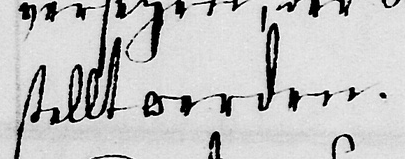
stellt werden.
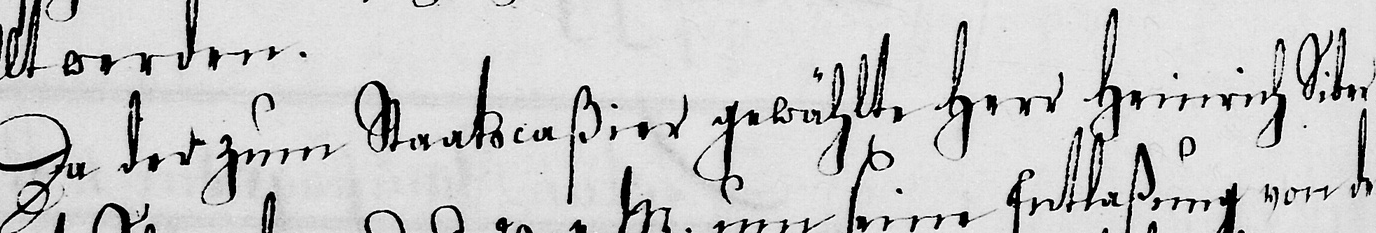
Da der zum Staatscaßier gewählte Herr Heinrich Sib¬
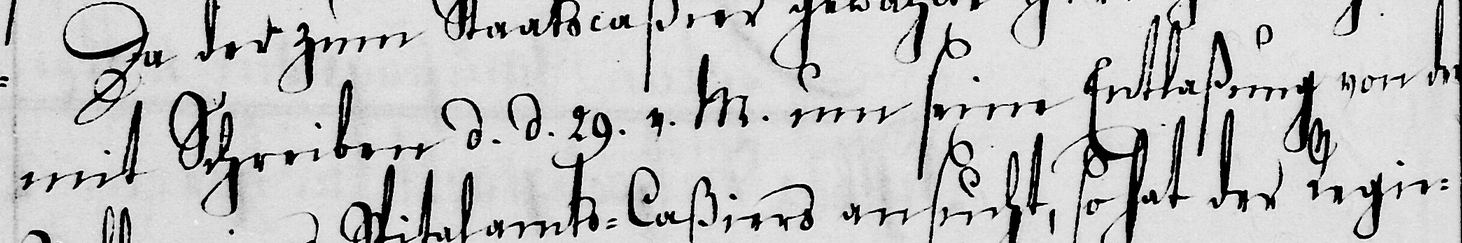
mit Schreiben d. d. 29. v. M. um seine Entlaßung von
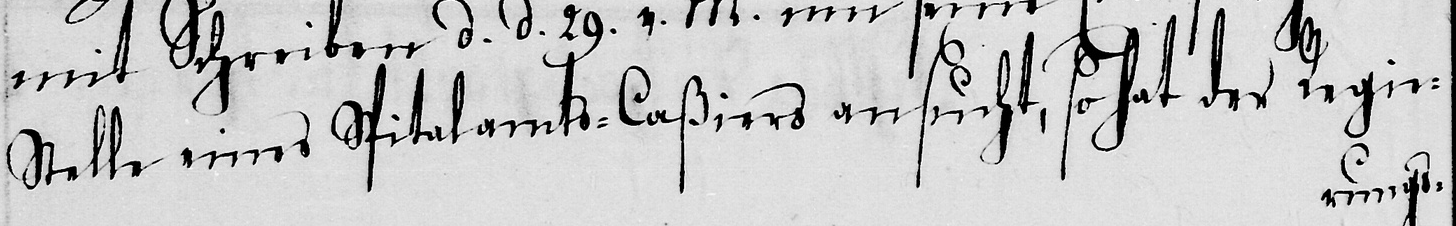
Stelle eines Spitalamts-Caßiers ansucht, so hat der Regie
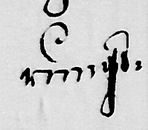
rungs¬
